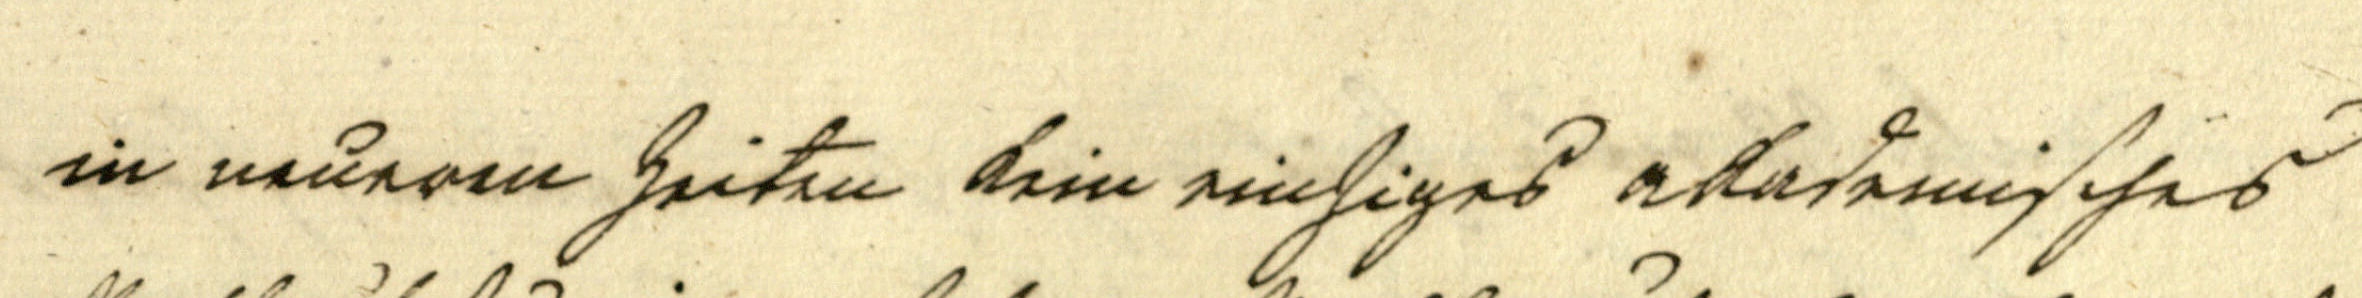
in neueren Zeiten kein einziges akademisches
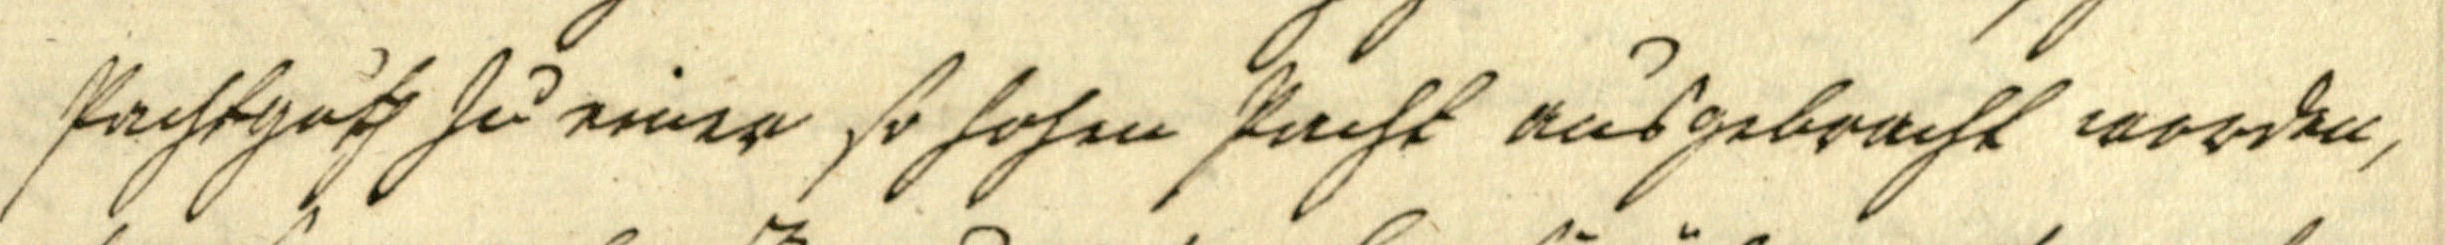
Pachtguth zu einer so hohen Pacht ausgebracht worden,
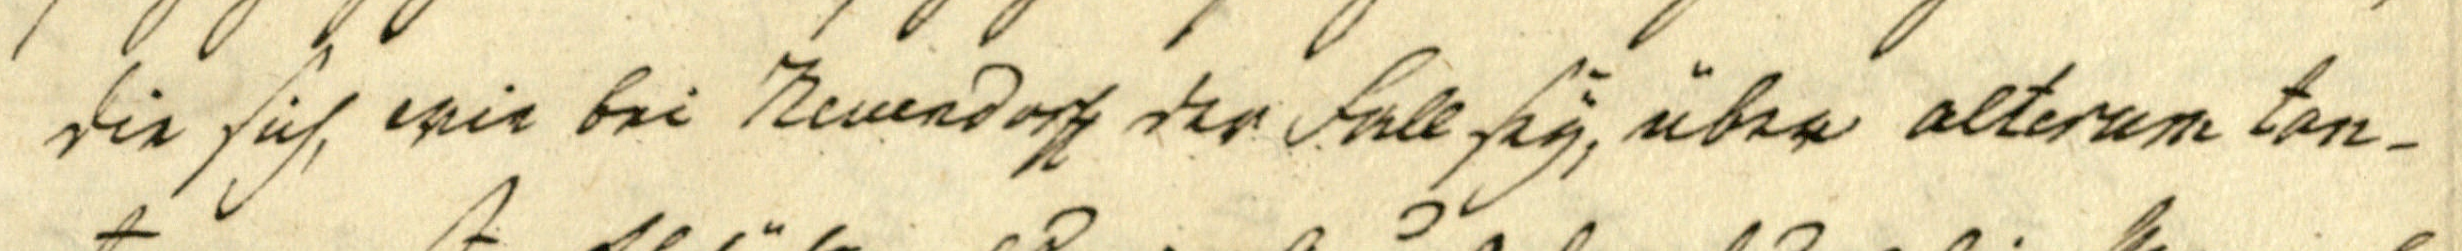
die sich, wie bei Neuendorff der Fall seÿ, über alterum tan¬
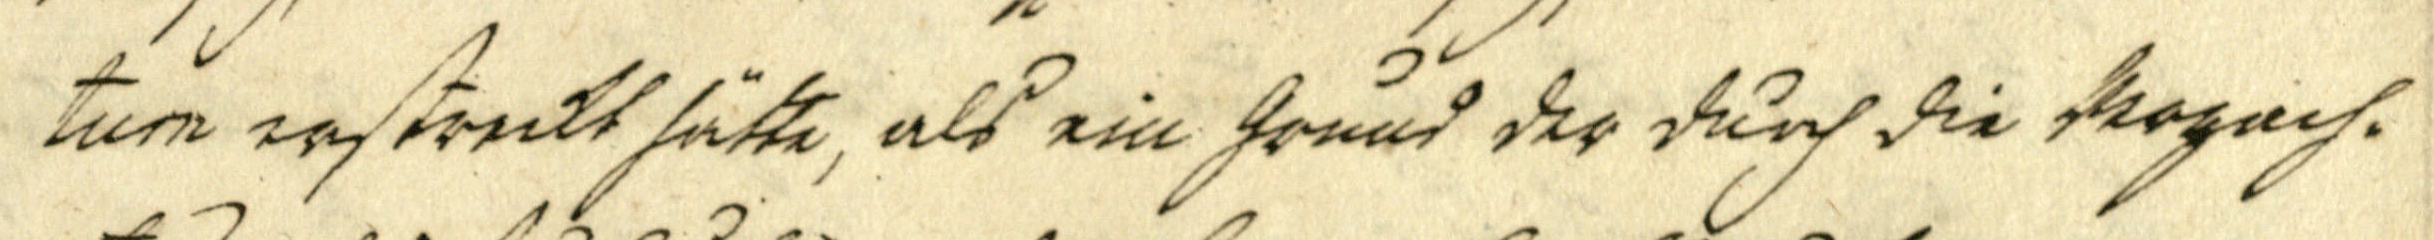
tum erstreckt hätte, als ein Grund der durch die Verpach¬
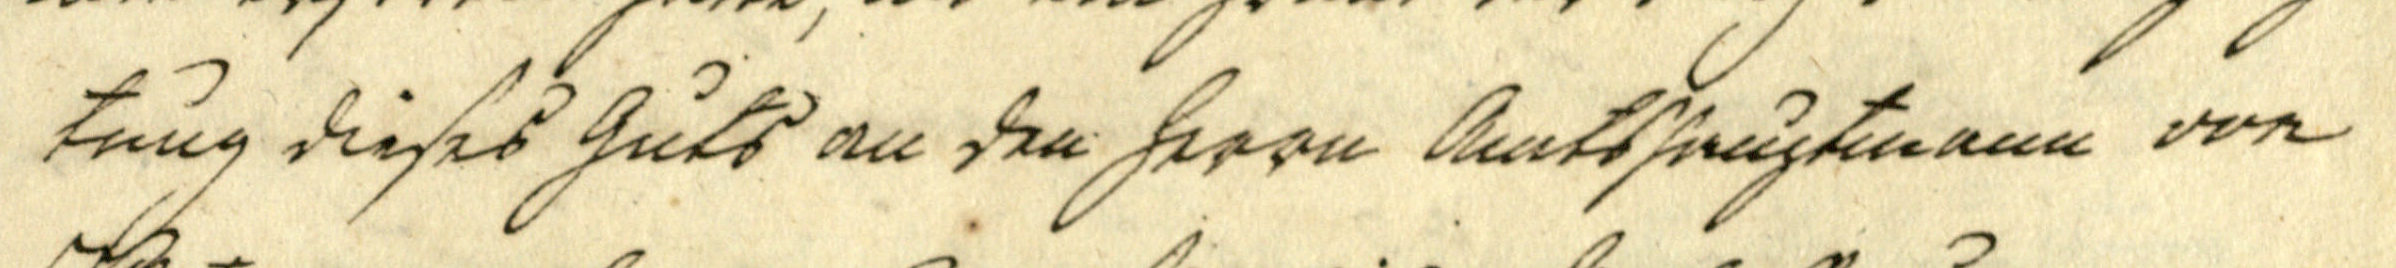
tung dieses Guts an den Herrn Amtshauptmann von
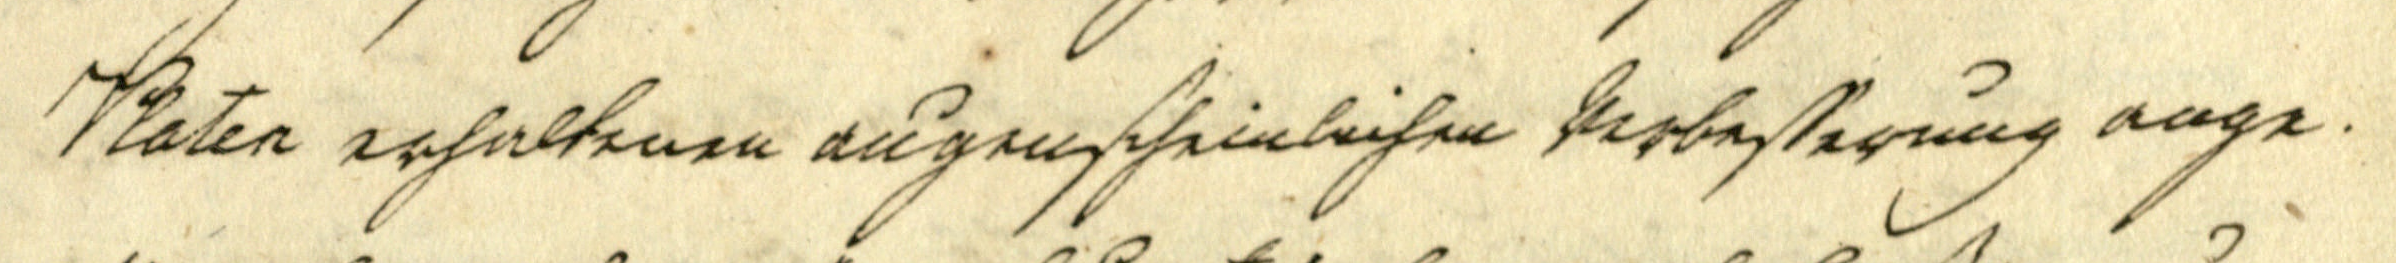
Platen erhaltenen augenscheinlichen Verbesserung ange¬
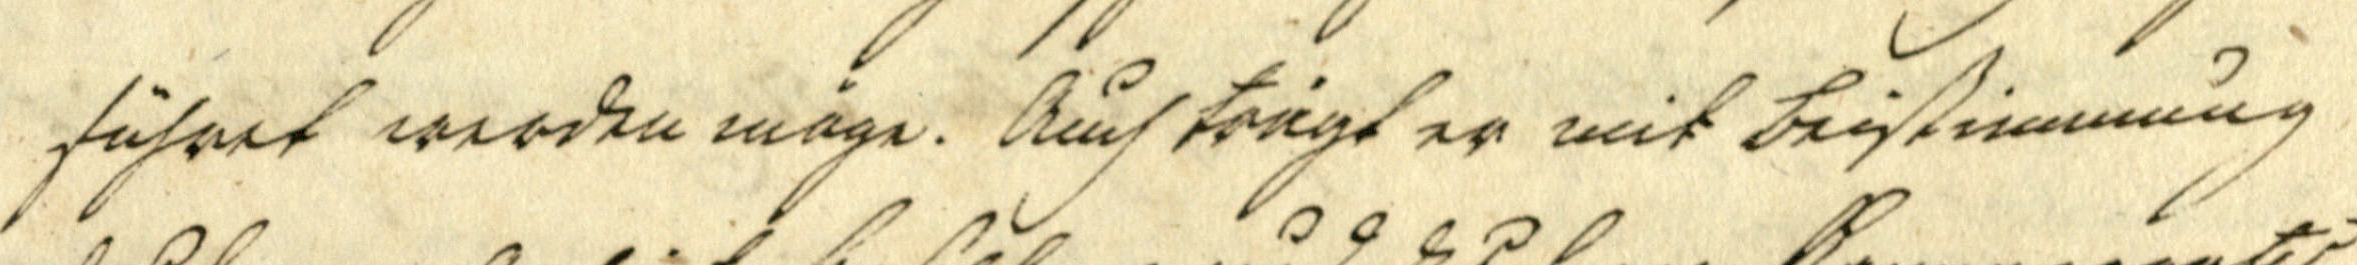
führet werden möge. Auch trägt er mit Beistimmung
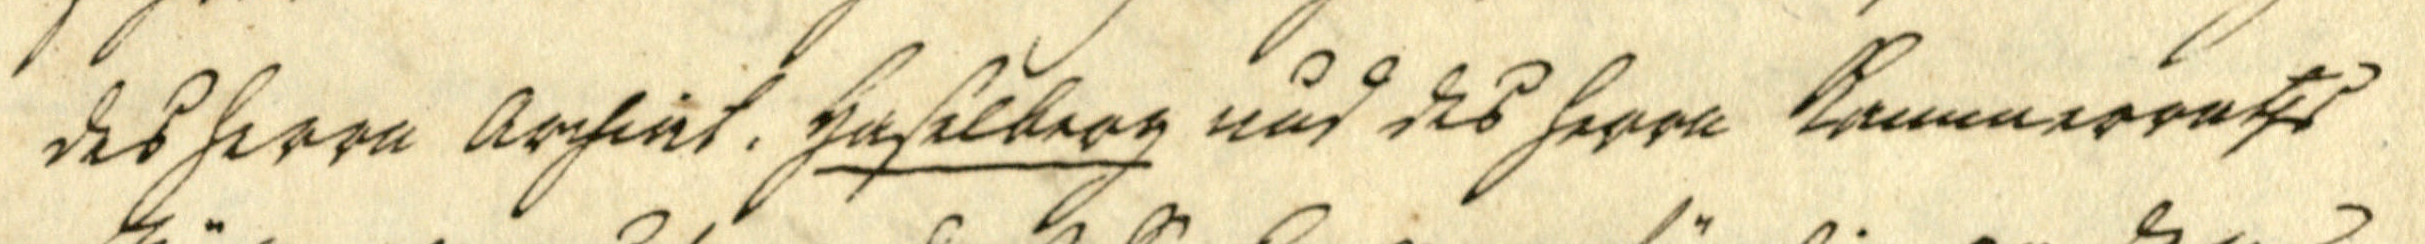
des Herrn Archiat. Haselberg und des Herrn Kammerraths
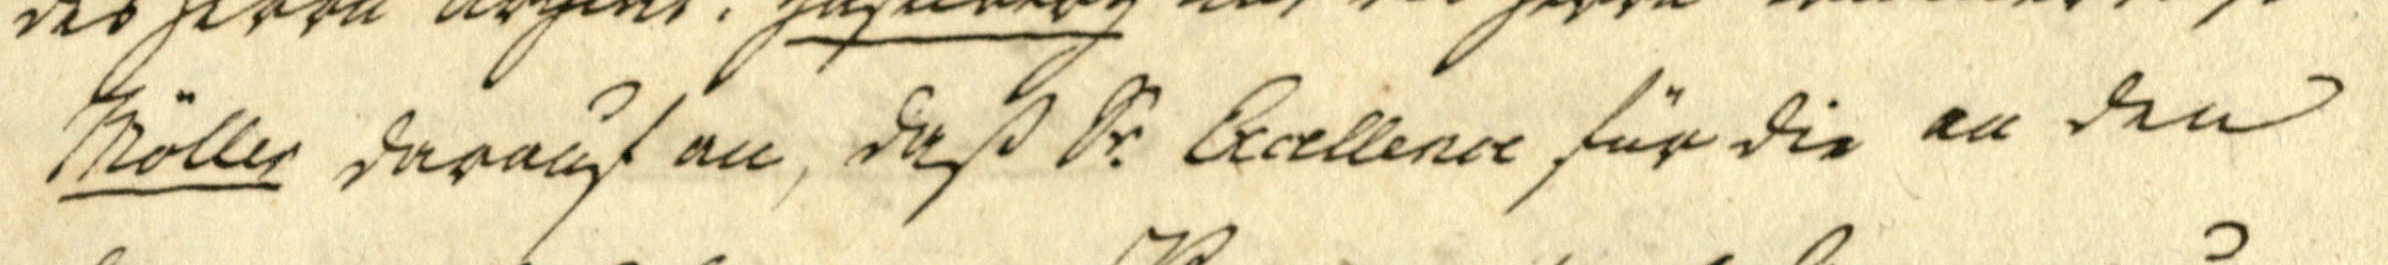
Möller darauf an, daß Sr Excellence für die an den
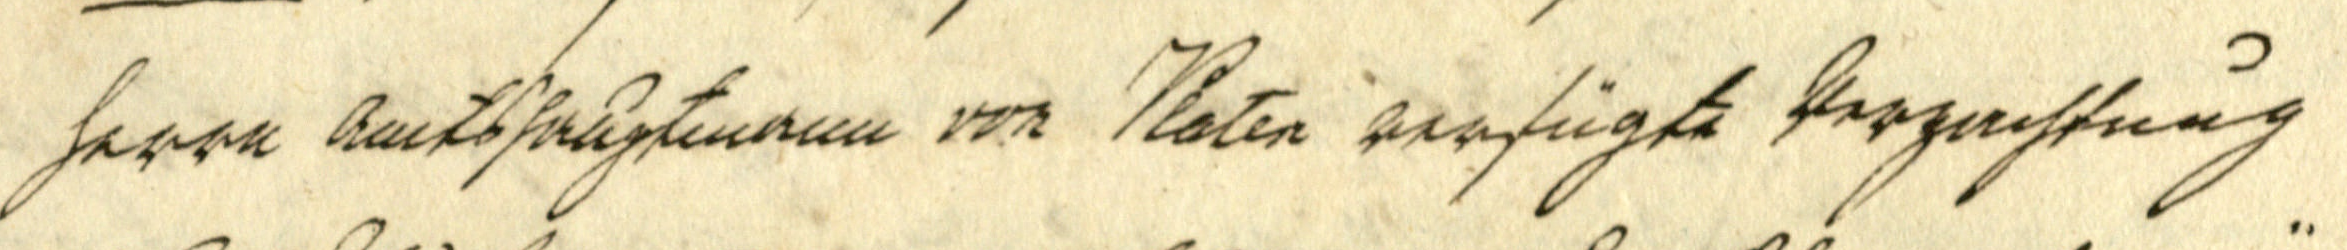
Herrn Amtshauptmann von Platen verfügte Verpachtung
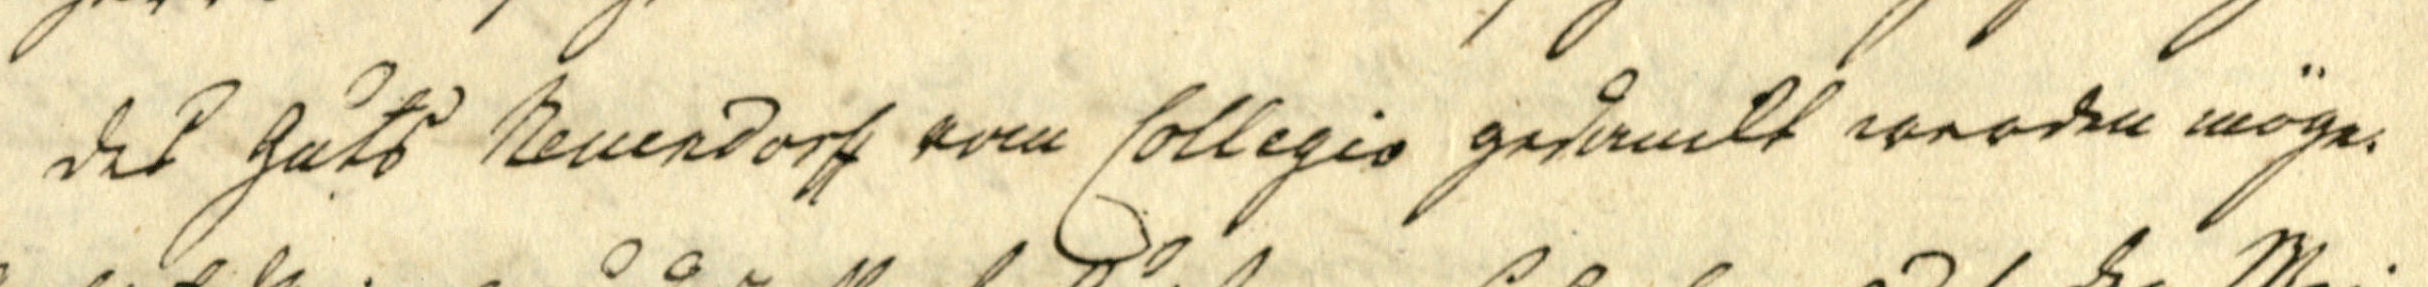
des Guts Neuendorff vom Collegio gedanckt werden möge.
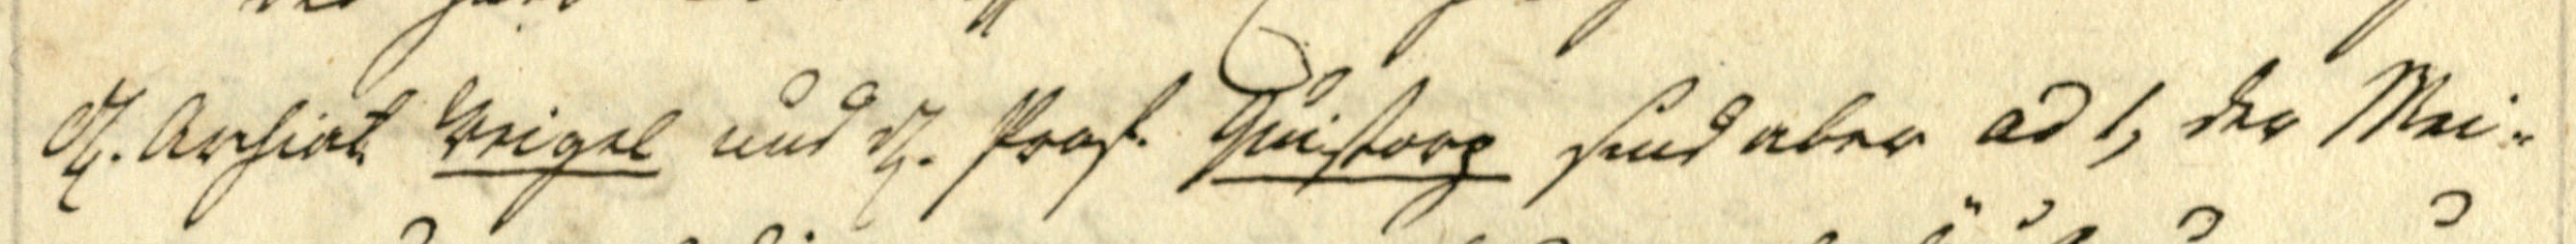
dh. Archiat. Weigel und dh. Prof. Quistorp sind aber ad 1, der Mei¬
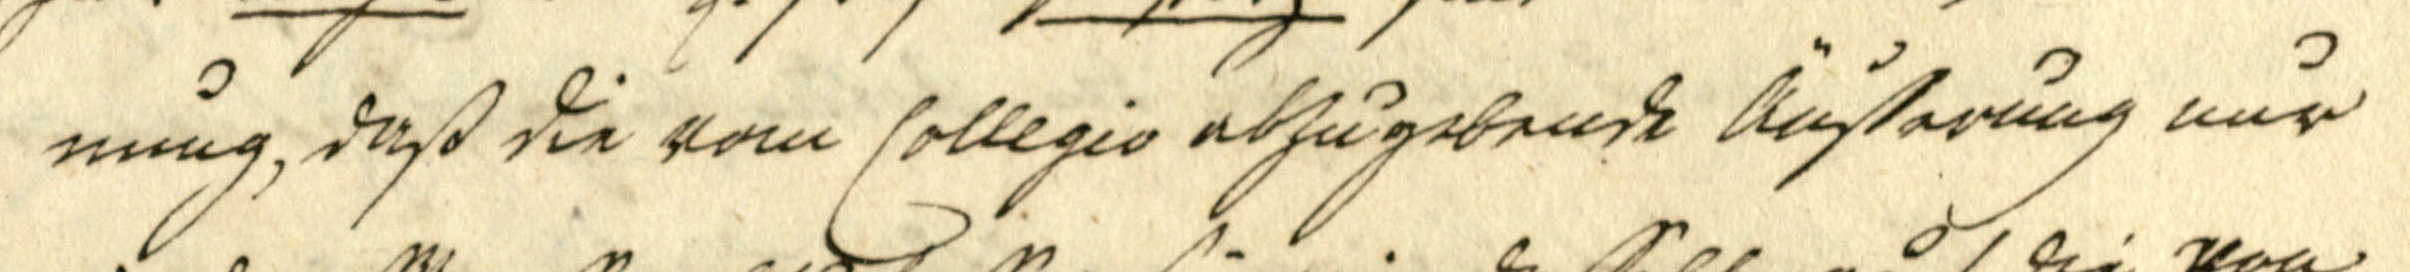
nung, daß die vom Collegio abzugebende Äusserung nur
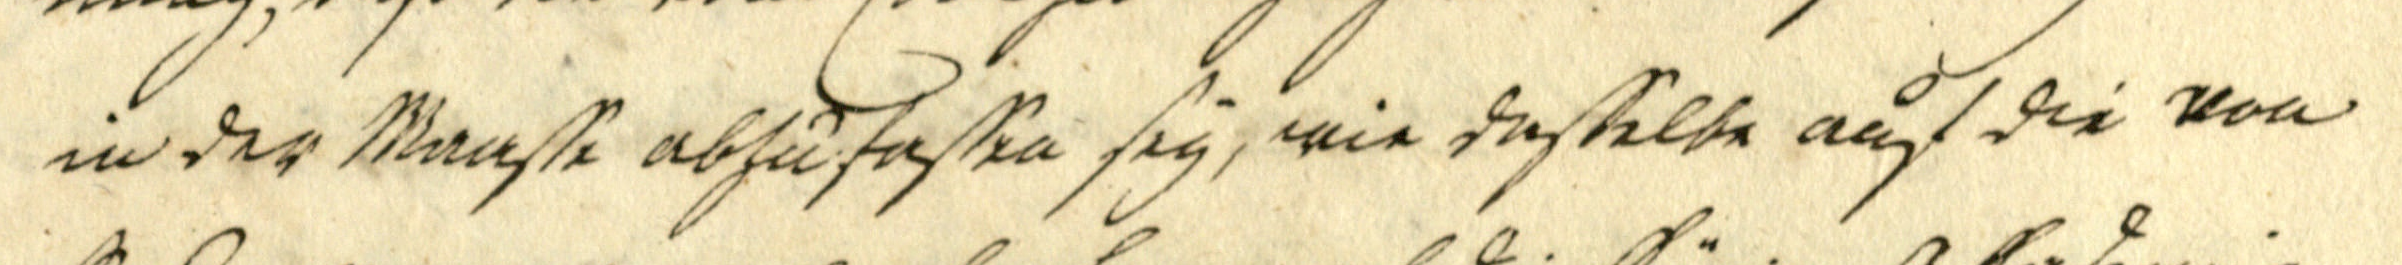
in der Maasse abzufassen seÿ, wie dasselbe auf die von
